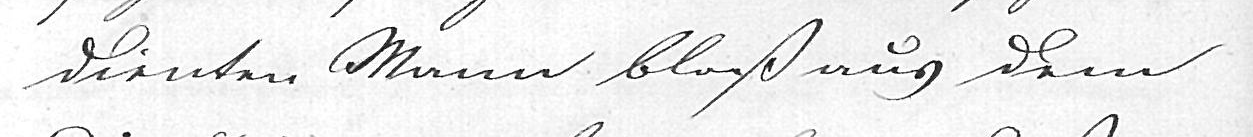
dienten Mann bloß aus dem
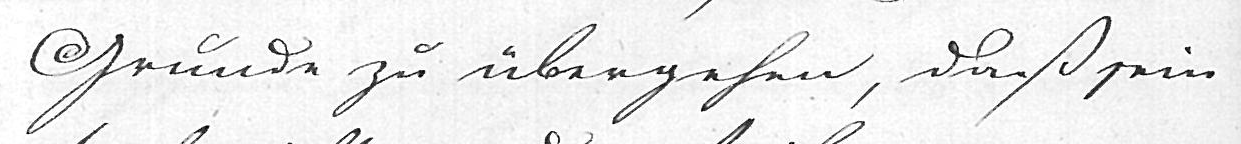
Grunde zu übergehen, daß sein
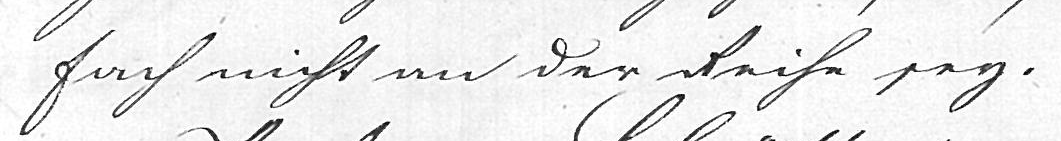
Fach nicht an der Reihe sey.
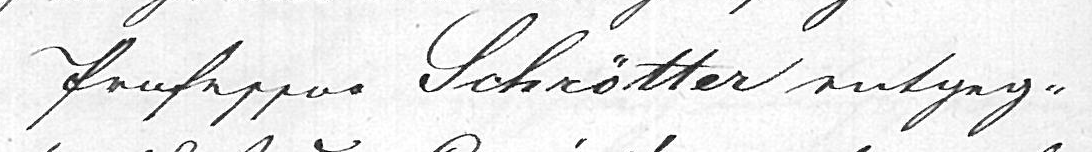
Professor Schrötter entgeg-
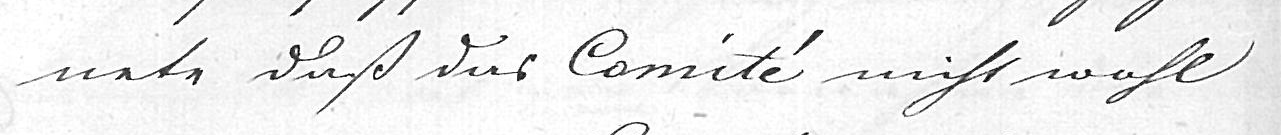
nete daß des Comité nicht wohl
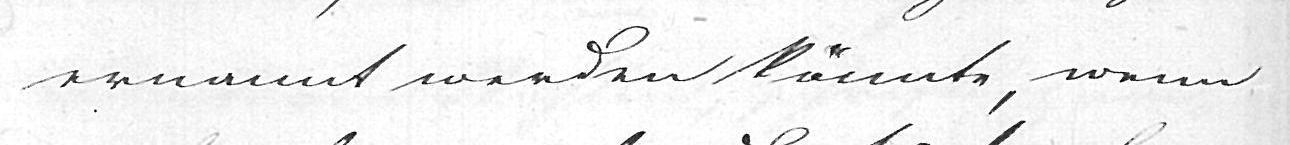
ernannt werden könnte, wenn
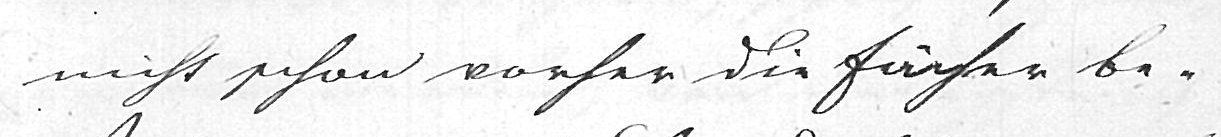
nicht schon vorher die Fächer be-
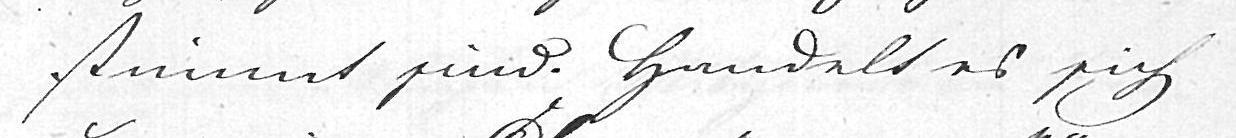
stimmt sind. Handelt es sich
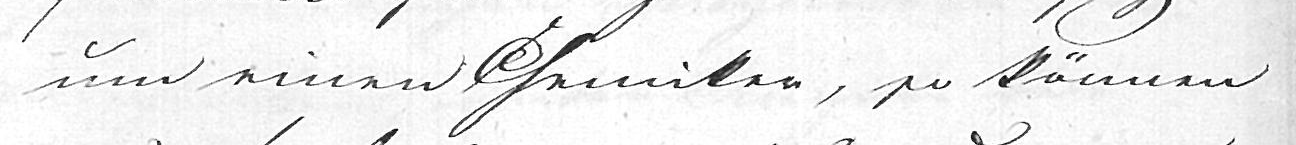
um einen Chemiker, so können
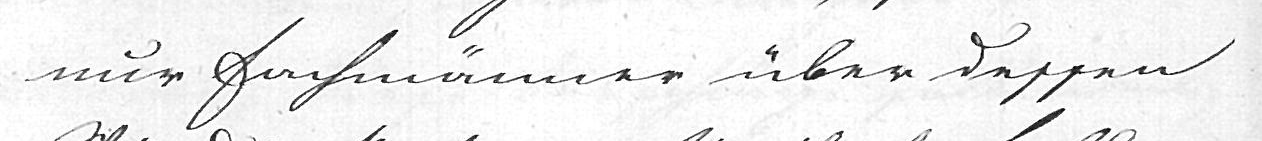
nur Fachmänner über dessen
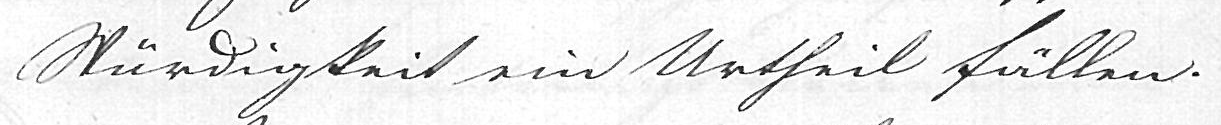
Würdigkeit ein Urtheil fällen.
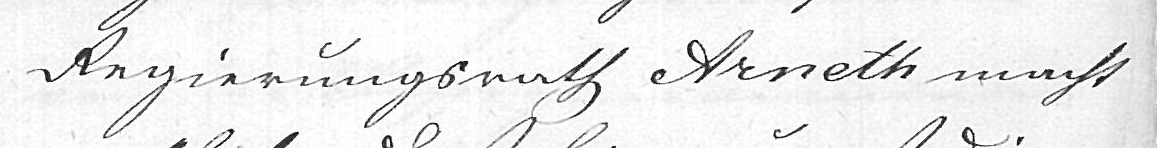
Regierungsrath Arneth macht
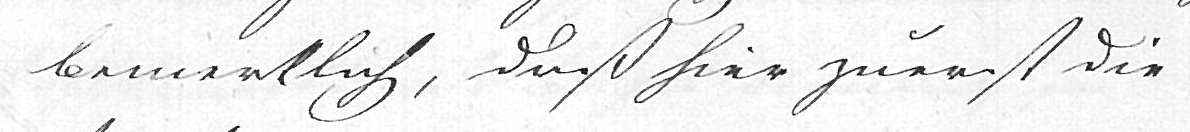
bemerklich, daß hier zuerst die
